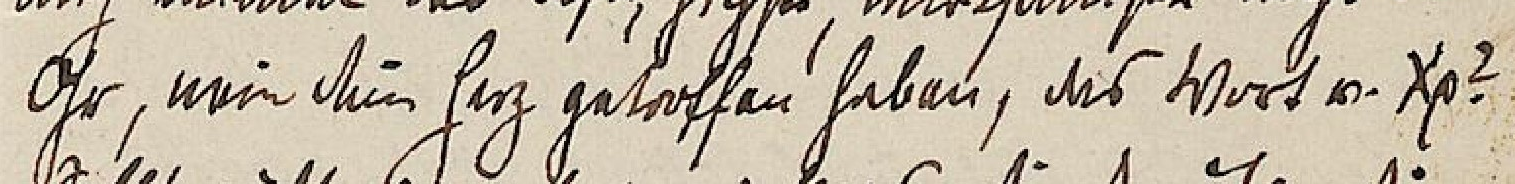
Ohr, nein dein Herz getroffen haben, das Wort v. Χρ?
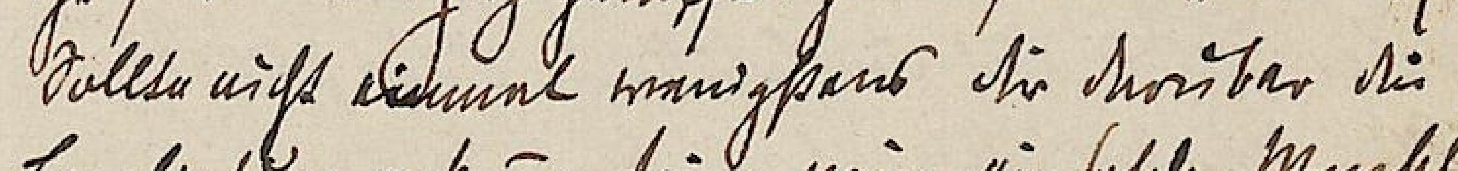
Sollte nicht einmal wenigstens dir darüber die
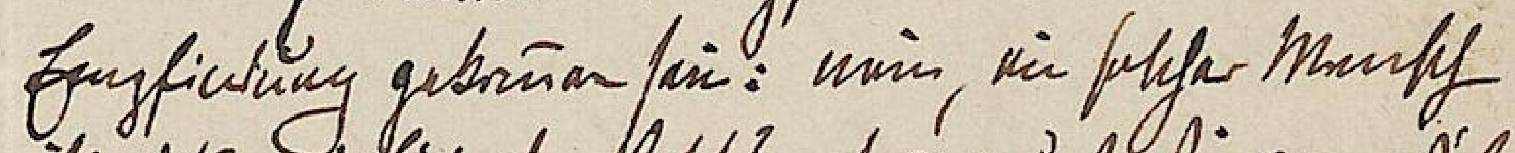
Empfindung gekommen sein: nein, ein solcher Mensch
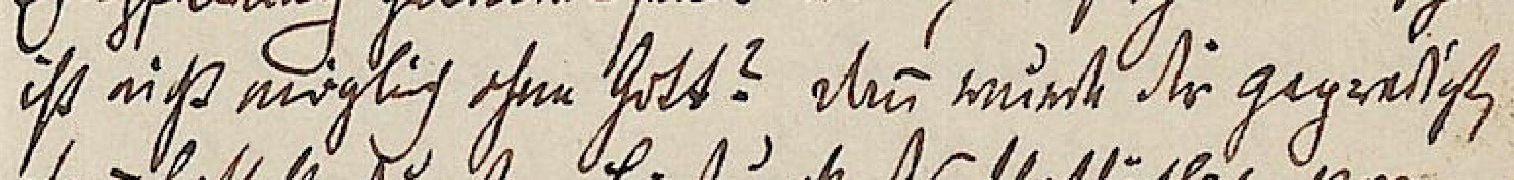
ist nicht möglich ohne Gott? Dan wurde die gepredigt,
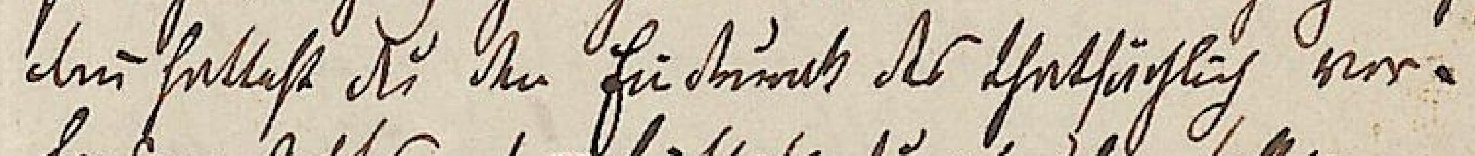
dann hattes du den Eindruck des thatsächlich vor¬
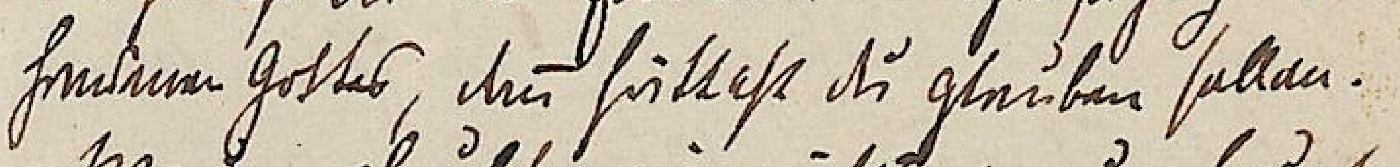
handenen Gottes, dann hättest du glauben sollen.
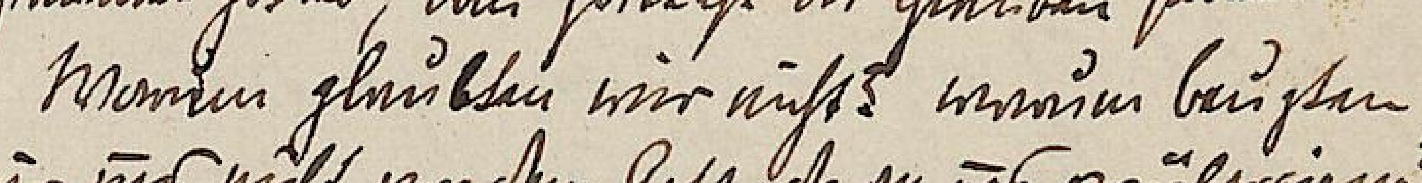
Warum glaubten wir nicht? warum beugten
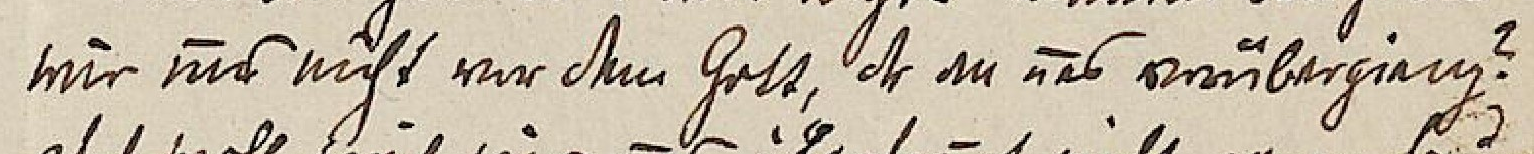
wir uns nicht vor dem Gott, der an uns vorüberging?
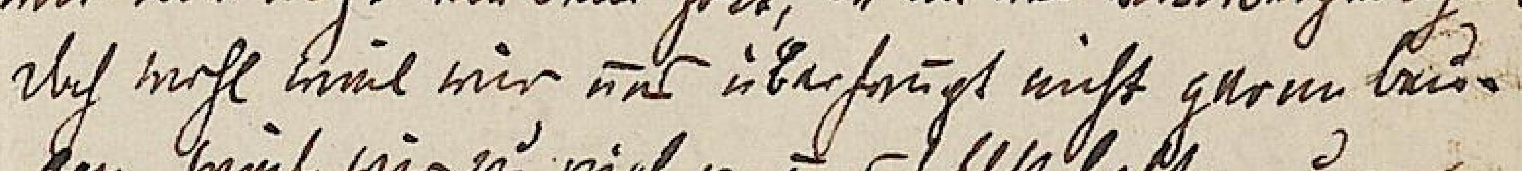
Doch wohl weil wir uns überhaupt nicht gern beu¬
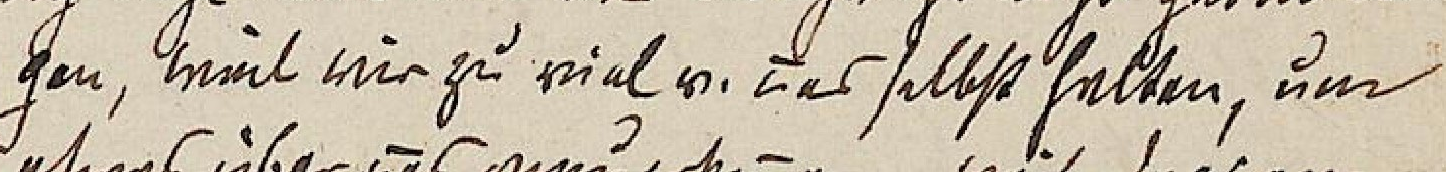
gen, weil wir zu viel v. uns selbst halten, um
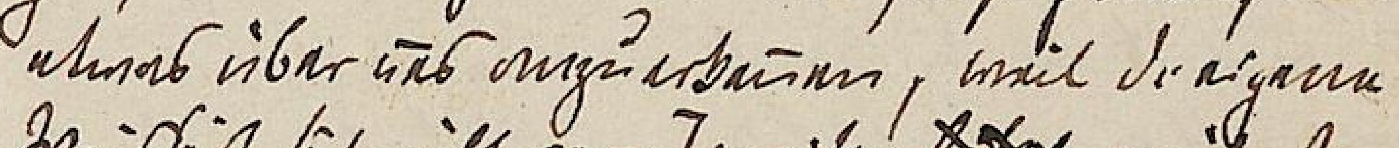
etwas über uns anzuerkennen, weil d. eigene
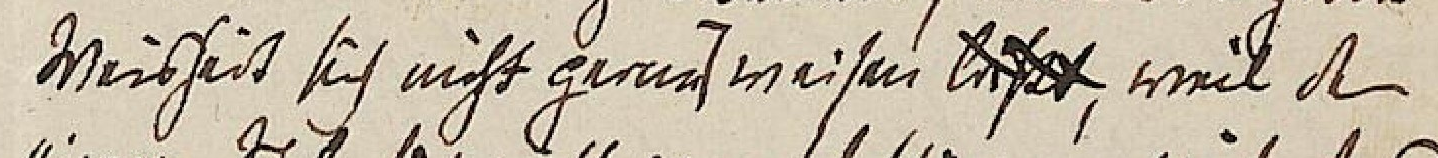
Weisheit sich nicht gern ] weisen läßt, weil der
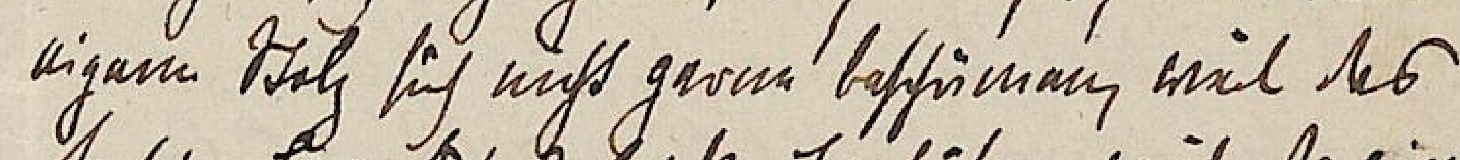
eigenen Stolz sich nicht gerne beschärmen, weil das
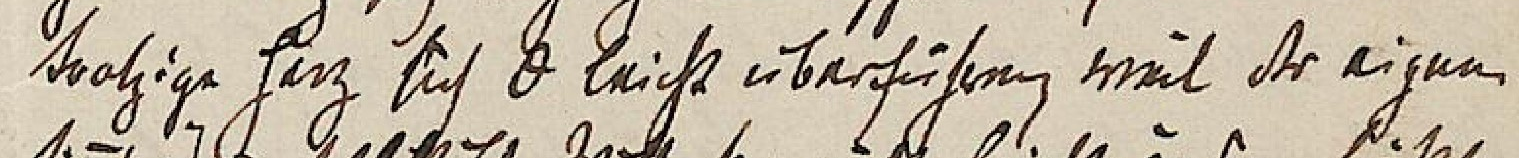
trotzige Herz sich o nicht leicht überführen, weil der eigene
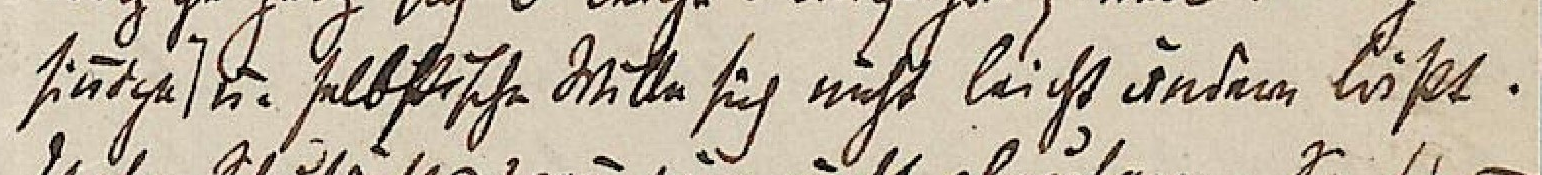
sinige ] u. selbstisch Wille sich nicht leicht ändern läßt.
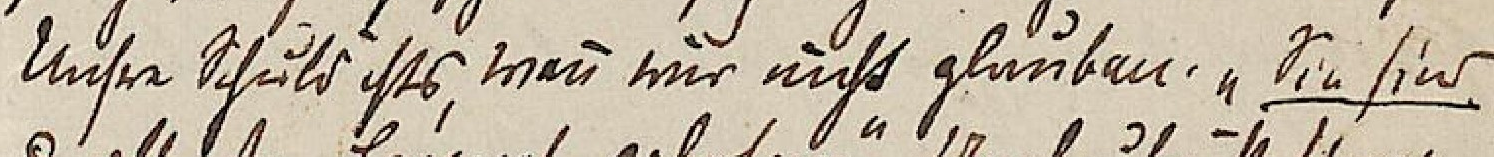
Unsere Schuld ists, wen wir nicht glauben. "Sie sind
